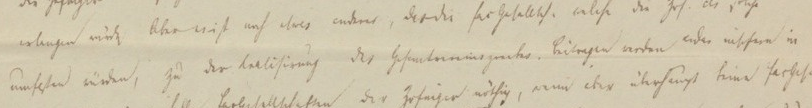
umfassen würden, zu der Realisirung des Gesamtvereinszwecks beitragen werden & das insofern in
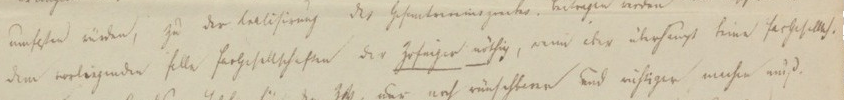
dem vorliegenden Falle FacGesellschaften der Zofingernöthig, wenn aber überhaupt keine FacGesellsch.
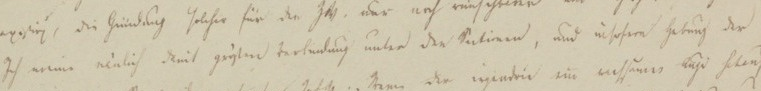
Ich meine nämlich damit größere Verbindung unter den Sectionen, und insofern Hebung der
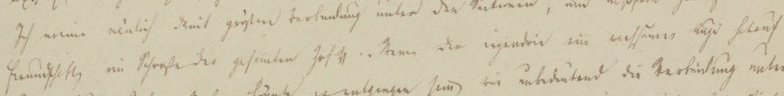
Freundschaften im Schooße des gesamten Zof.V. Wem der irgendwie ein wachsames Auge hat auf
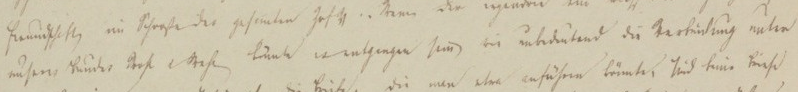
unsers Bundes Wohl & Wehe, könnte es entgangen sein, wie unbedeutend die Verbindung unter
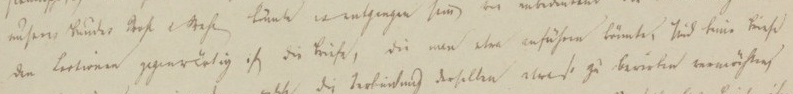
den Sectionen gegenwärtig ist. Die Briefe, die man etwa anführen könnte, sind keine Briefe
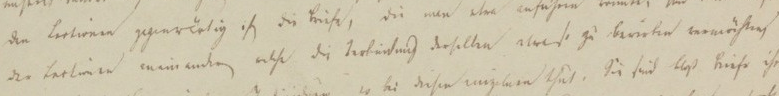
der Sectionen aneinander, welche die Verbindung derselben etwa so zu bewirken vermöchten,
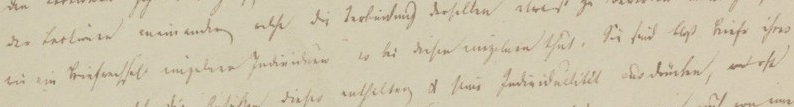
wie ein Briefwechsel einzelner Individuen es bei diesen einzelnen thut. Sie sind bloß Briefe ihres
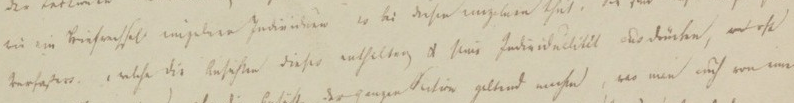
Verfassers, welche die Ansichten dieses enthalten & seine Individualität ausdrücken, oft
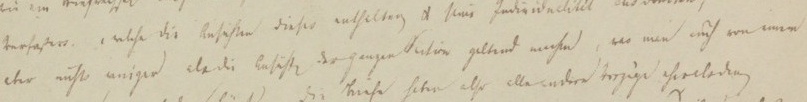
aber nichts weniger als die Ansichten der ganzen Section geltend machen, was man auch von einem
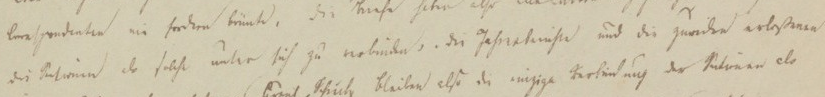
die Sectionen als solche unter sich zu verbinden. Die Jahresberichte und die zuweilen erlassenen
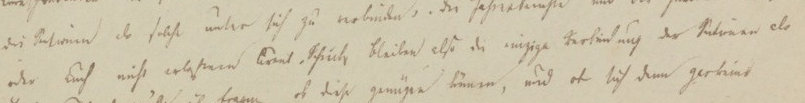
oder auch nicht erlassenen Circul Schreiben bleiben also die einzige Verbindung der Sectionen als
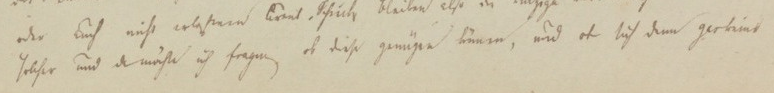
solcher und da möchte ich fragen, ob diese genügen können, und ob sich denn gar keine
